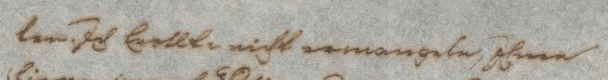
len. Ich wollte nicht ermangeln, Ihnen
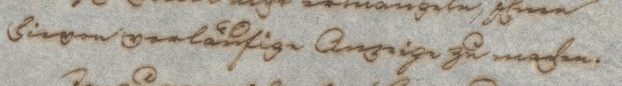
hievon vorläufige Anzeige zu machen.
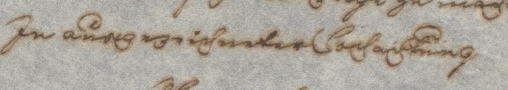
In ausgezeichneter Hochachtung
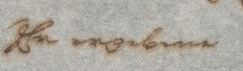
Ihr ergebener
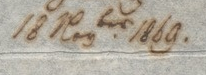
18 Novber 1869.
